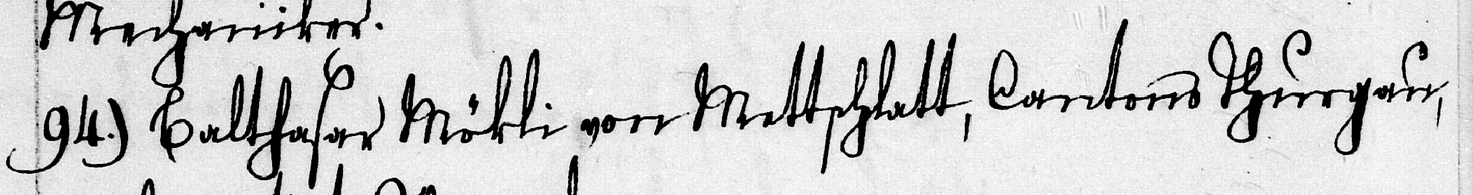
94.) Balthasar Mökli von Mettschlatt, Cantons Thurgau,
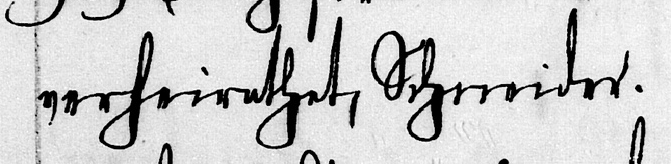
verheirathet, Schneider.
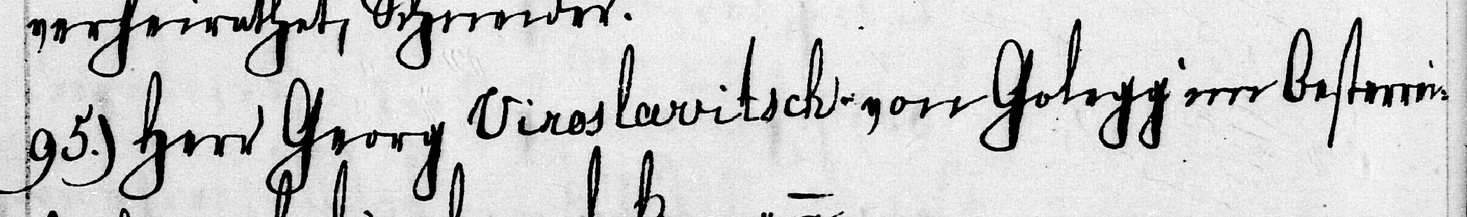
95.) Herr Georg Viroslavitsch von Golegg im Oesterre¬
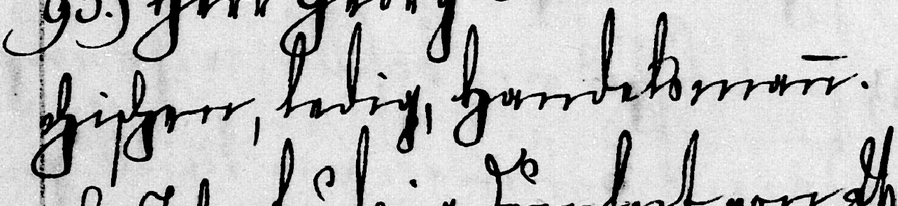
ichischen, ledig, Handelsmann.
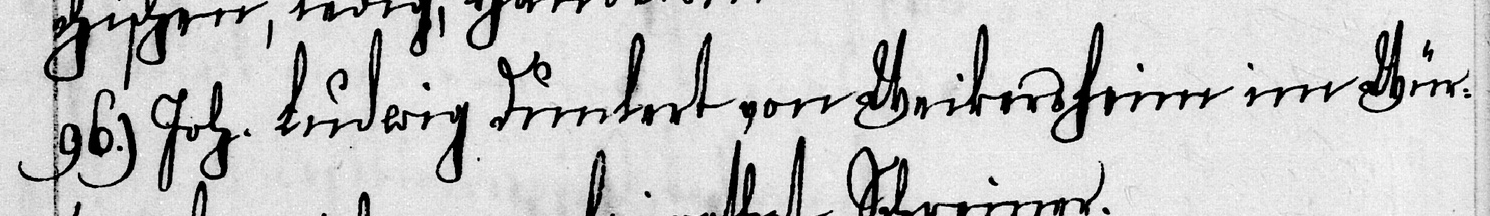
96.) Joh. Ludwig Dunlert von Weikersheim im Wür¬
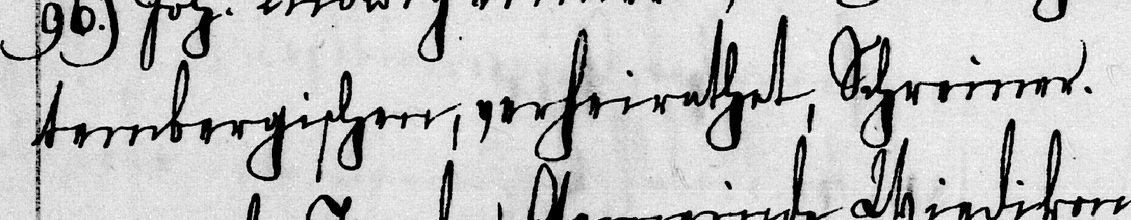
tembergsichen, verheirathet, Schreiner.
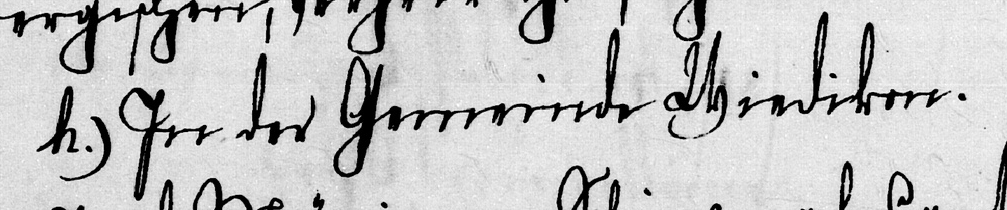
h.) In der Gemeinde Wiedikon.
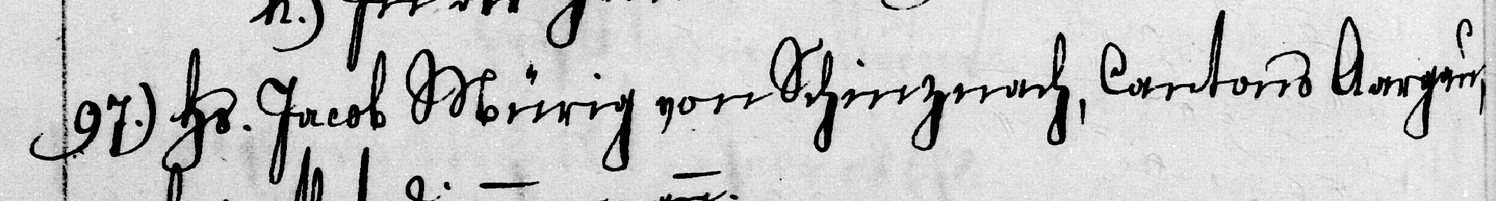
97.) Hs. Jacob Mürig von Schinznach, Cantons Aargau,
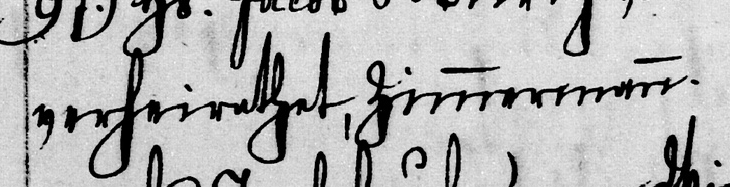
verheirathet, Zimmermann.
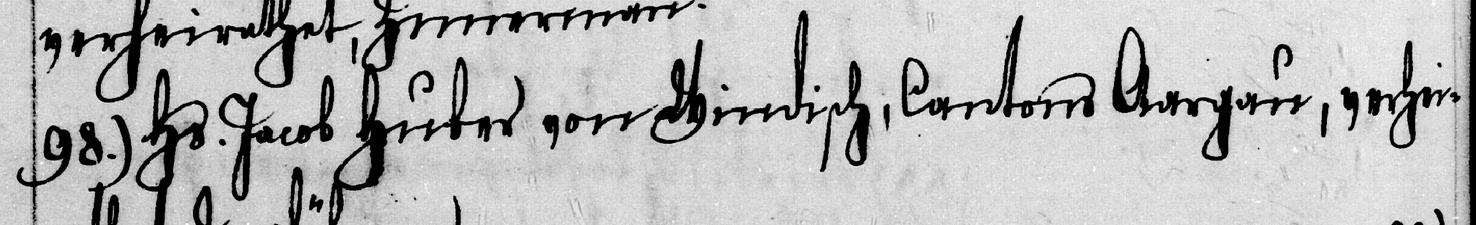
98.) Hs. Jacob Huber von Windisch, Cantons Aargau, verhei¬
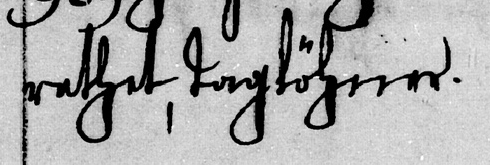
rathet, Taglöhner.
